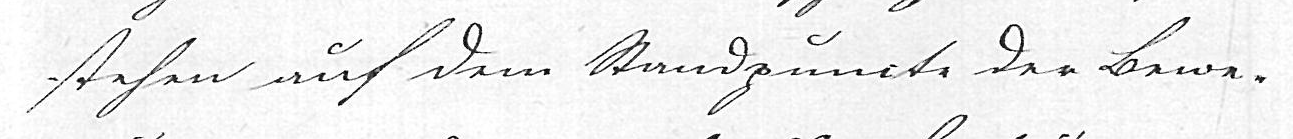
stehen auf dem Standpuncte der Bewe-
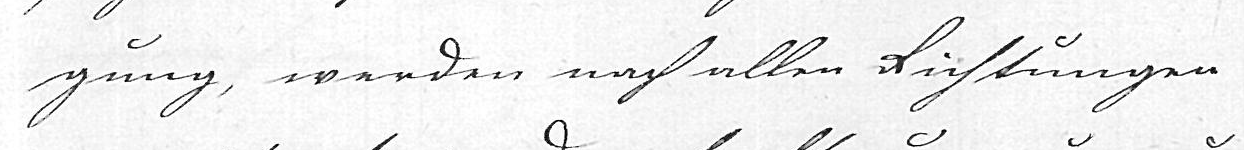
gung, werden nach allen Richtungen
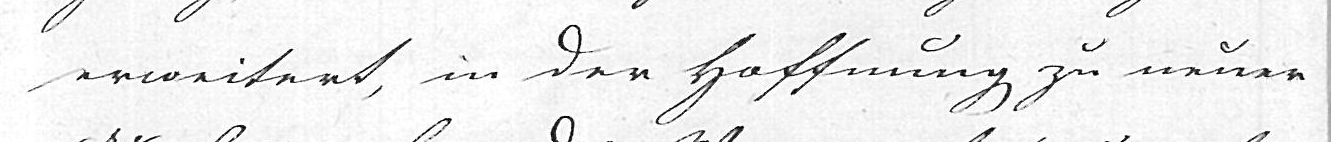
erweitert, in der Hoffung zu neuer
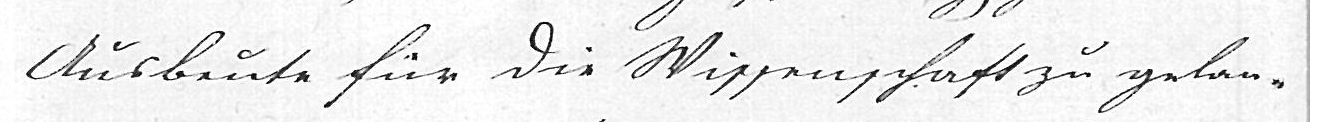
Ausbeute für die Wissenschaft zu gelan-
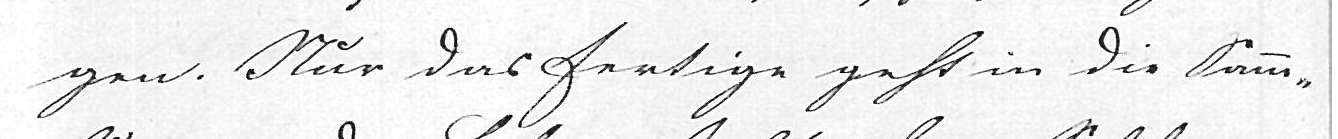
gen. Nur das Fertige geht in die Samm-
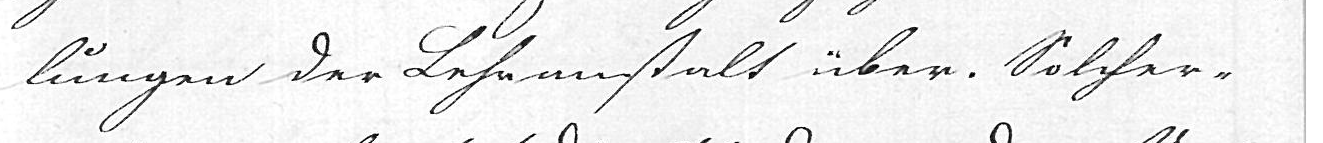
lungen der Lehranstalt über. Solcher-
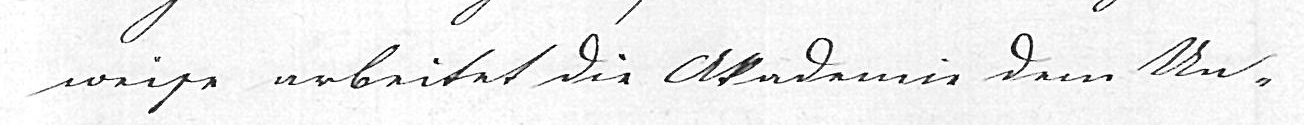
weise arbeitet die Akademie dem Un-
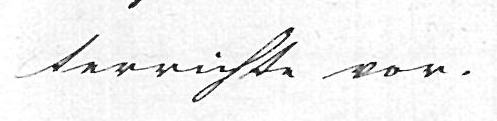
terrichte vor.
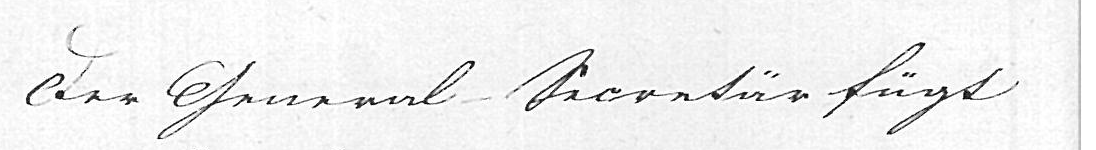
Der General-Secretär fügt
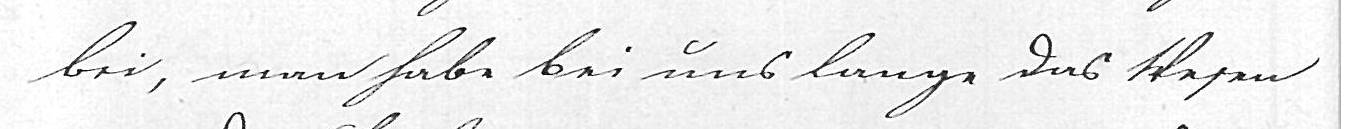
bei, man habe bei uns lange das Wesen
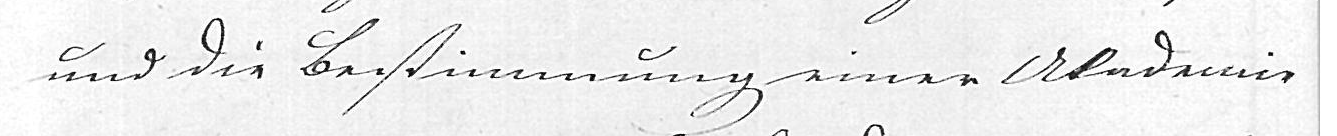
und die Besimmung einer Akademie
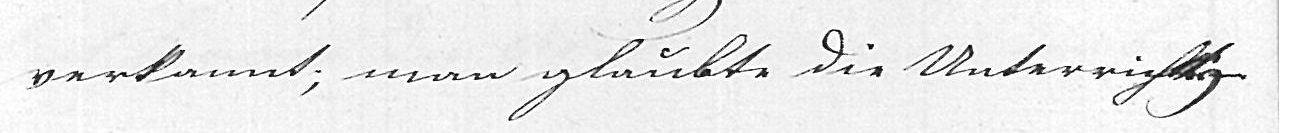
verkannt; man glaubte die Unterrichts-
